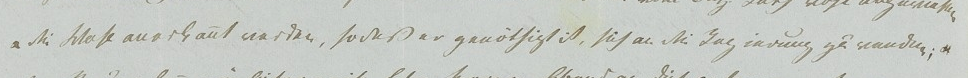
& die Wahl anerkannt werden, sodaß er genöthigt ist, sich an die Regierung zu wenden, &
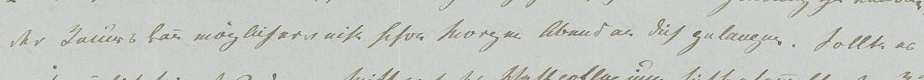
der Recurs kann möglicherweise schon morgen Abend an dich gelangen. Sollte es
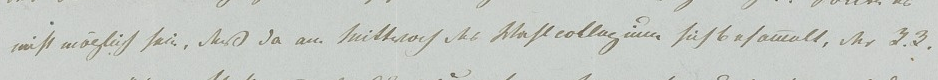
nicht möglich sein, daß da am Mittwoch das Wahlcollegium sich besammelt, der R.R.
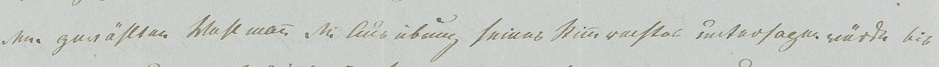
dem gewählten Wahlmann die Ausübung seines Stimmrechtes untersagen würde bis
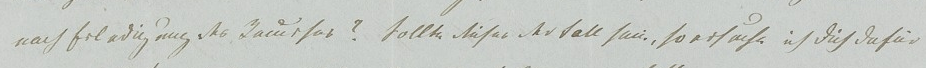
nach Erledigung des Recurses? Sollte dieses der Fall sein, so ersuche ich Dich dafür
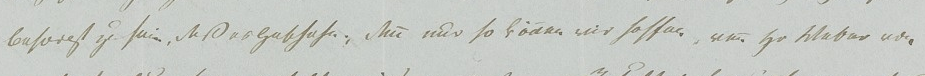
besorgt zu sein, daß es geschehe, denn nur so können wir hoffen, wenn Hr Weber von
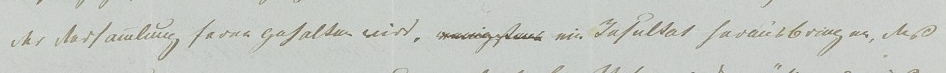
der Versammlung ferne gehalten wird, wenigstens ein Resultat herausbringen, daß
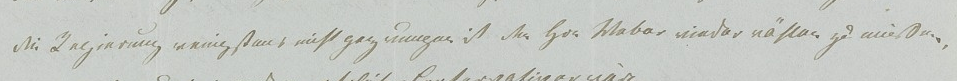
die Regierung wenigstens nicht gezwungen ist den Hrn Weber wieder wählen zu müssen,
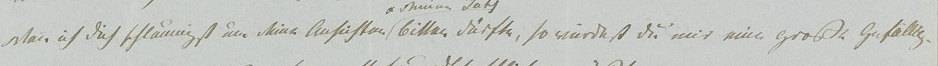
Wenn ich Dich schleunigst um deine Ansichten & deinen Rath bitten dürfte, so würdest du mir eine große Gefällig-
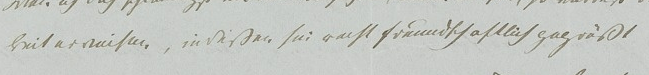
keit erweisen, indessen sei recht freundschaftlich gegrüßt
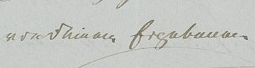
von deinem Ergebenen
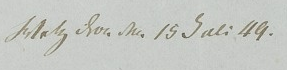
Wetzikon den 15 Juli 49.
